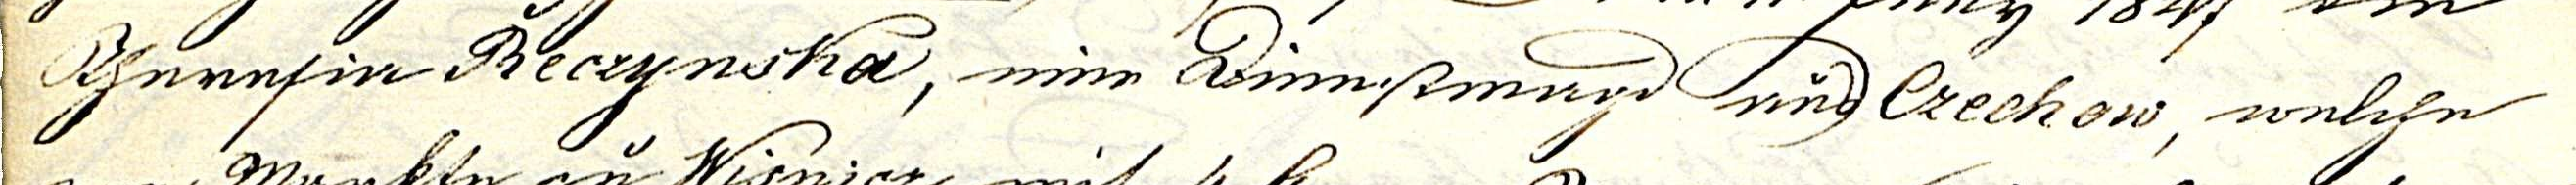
Theresie Řeczynska, eine Dienstmagd aus Czechow, welche
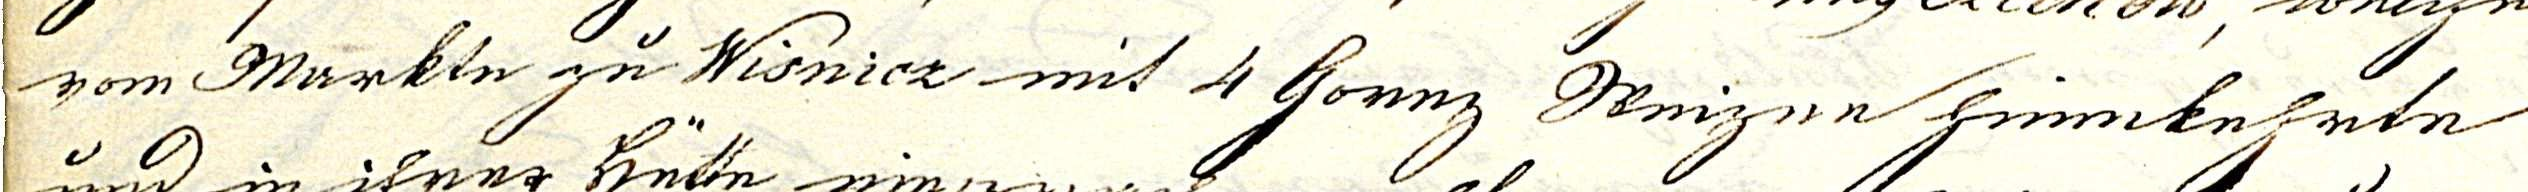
vom Markte zu Wisnicz mit 4 Gorez Weizen heimkehrte
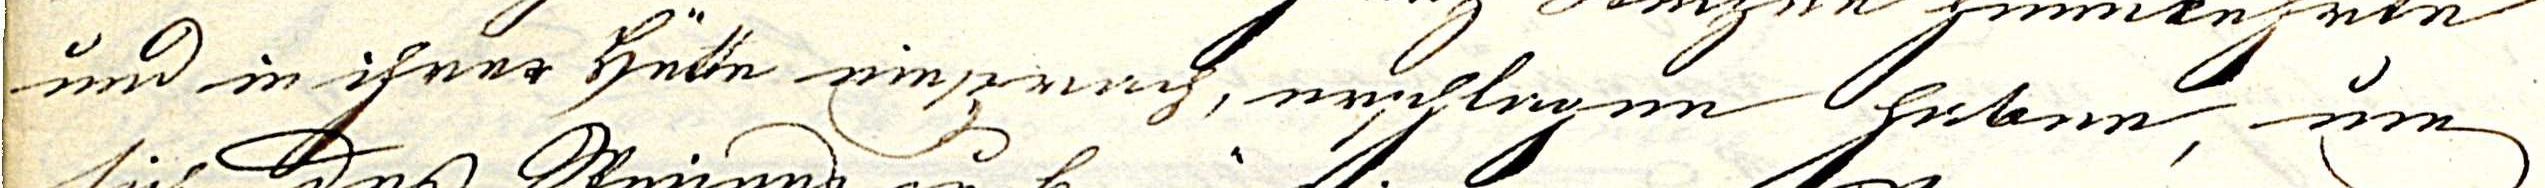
und in ihrer Hütte einprach, erschlagen haben, um
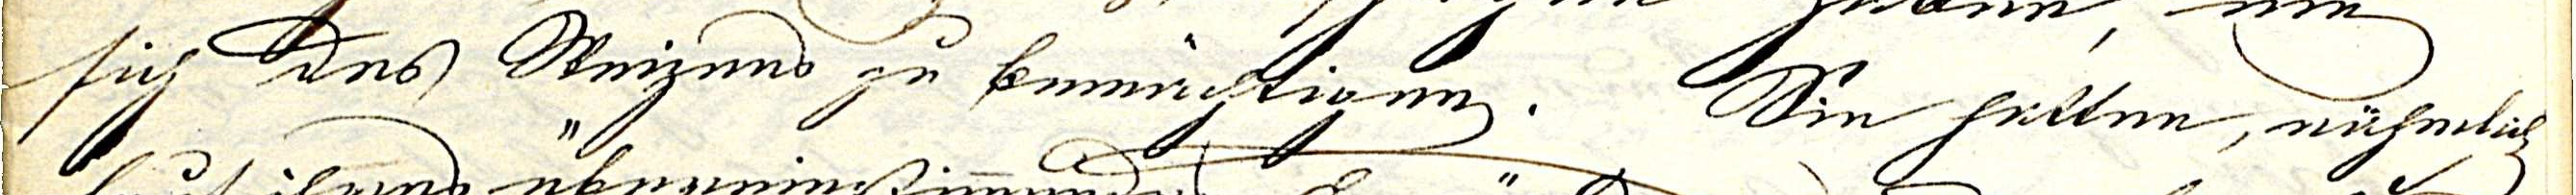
sich das Weizens zu bemächtigen. Sie hatten, nämlich
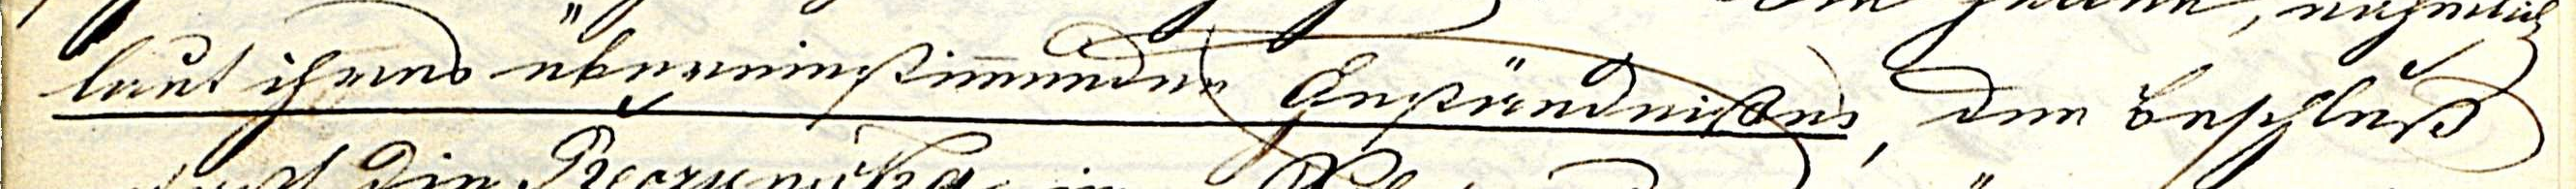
laut ihres übereinstimmenden Geständnißes, dem Beschluß
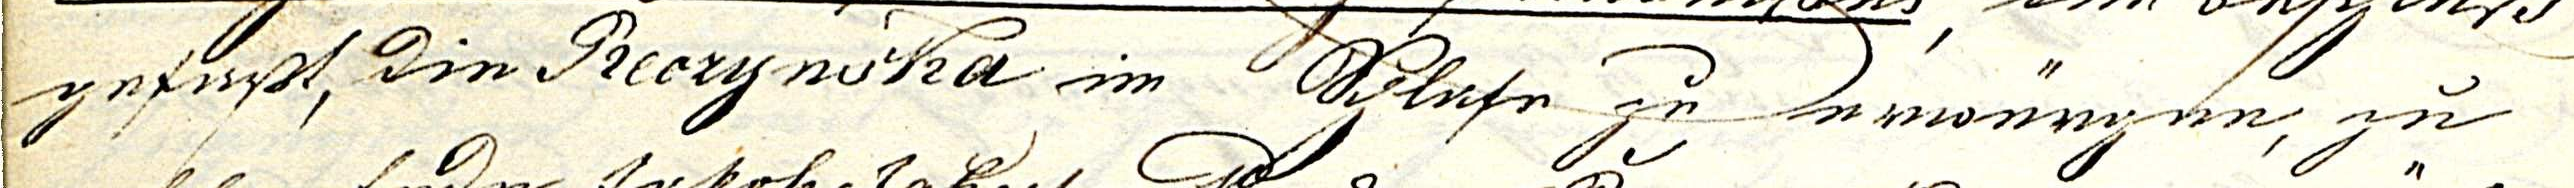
gefaßt, die Řeczynska im Schlafe zu erwürgen, zu
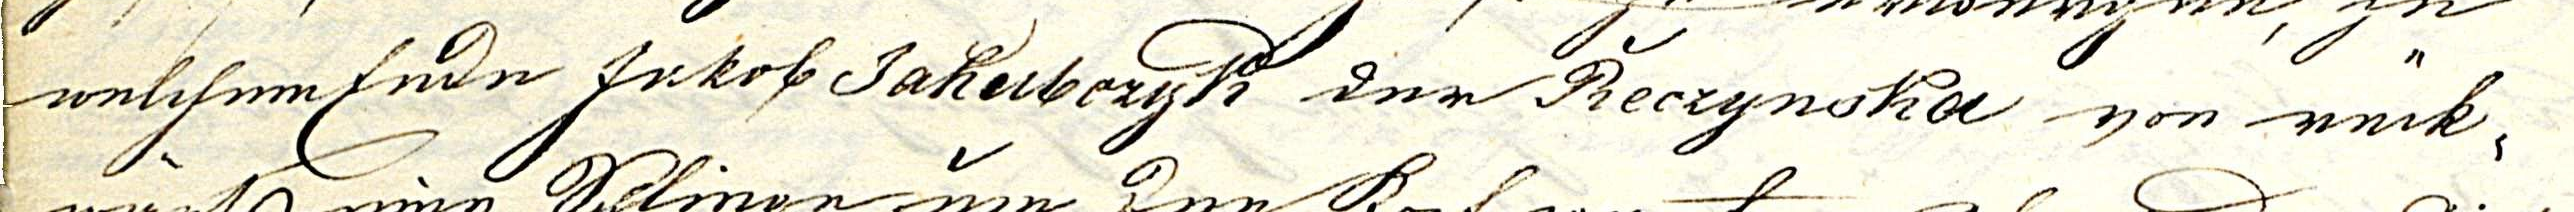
welchem Ende Jakob Jakubczyk der Řeczynska von rück¬
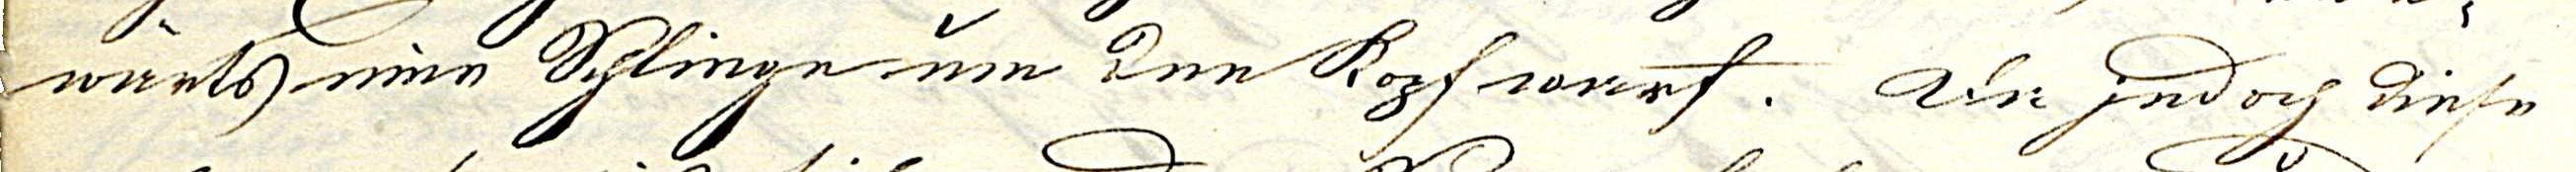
wärts eine Schlinge um den Kopf warf. Da jedoch diese
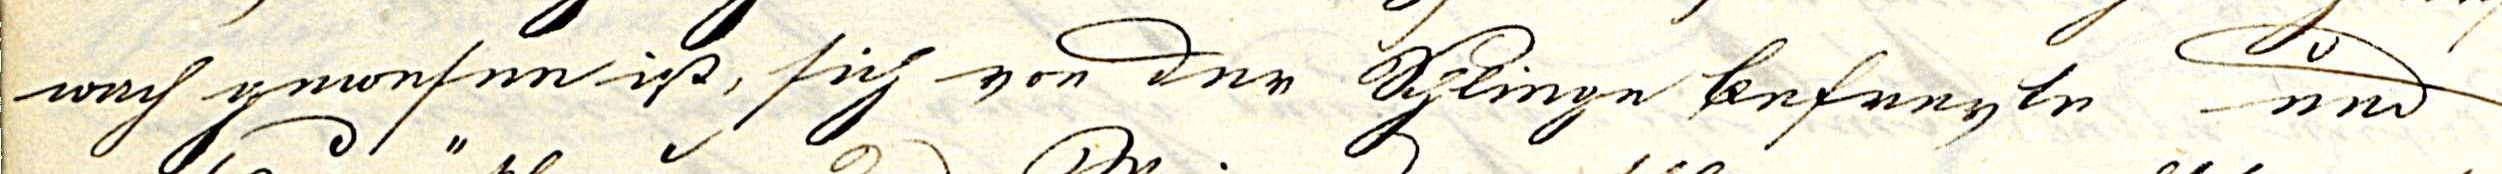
wach gewesen ist, sich von der Schlinge befreyte und
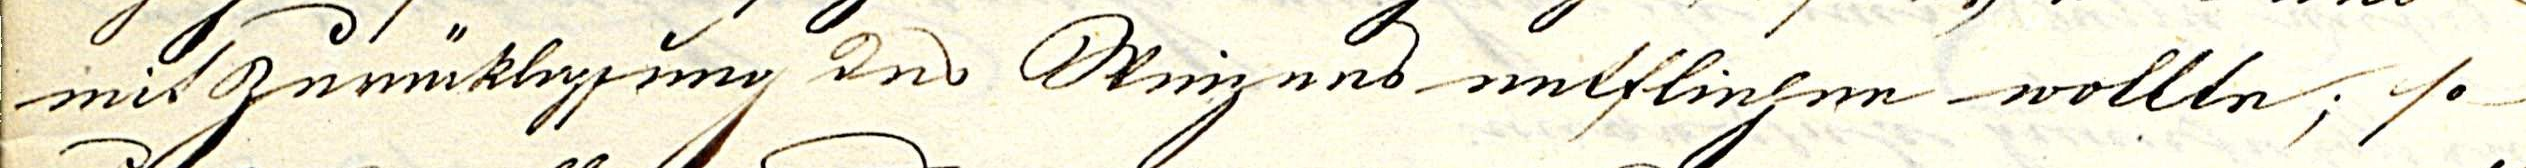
mit Zurücklassung des Weizens entfliehen wollte; so
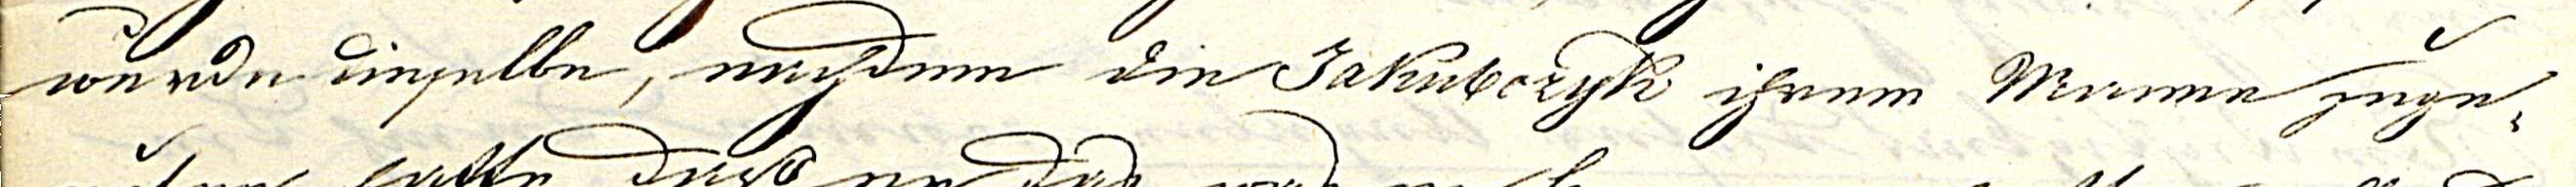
wurde dieselbe, nachdem die Jakubczyk ihrem Manne zuge¬
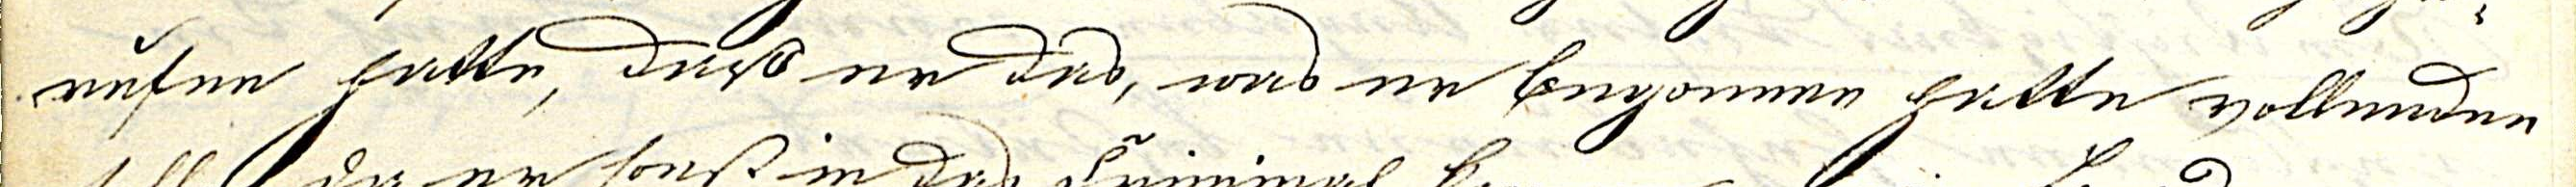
rufen hatte, daß er das, was er begonnen hatte vollenden
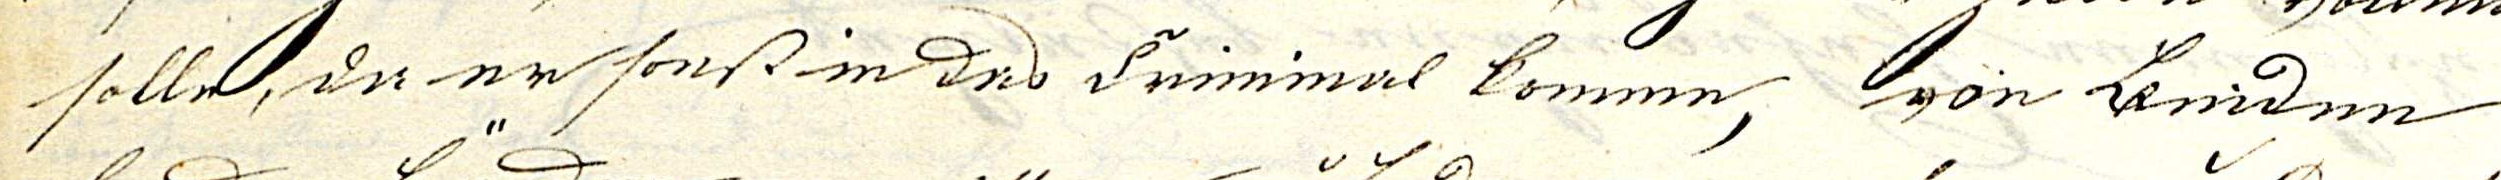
solle, da er sonst in das Criminal komme, von Beiden
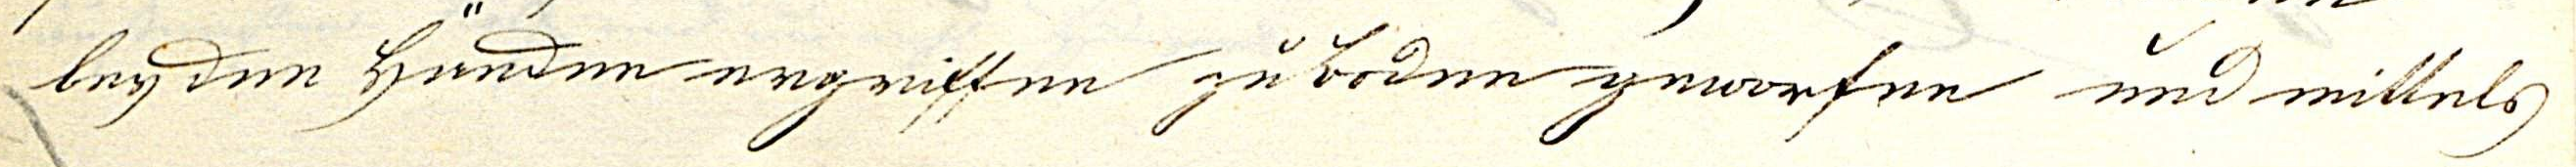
bey den Händen ergriffen zu Boden geworfen und mittels
